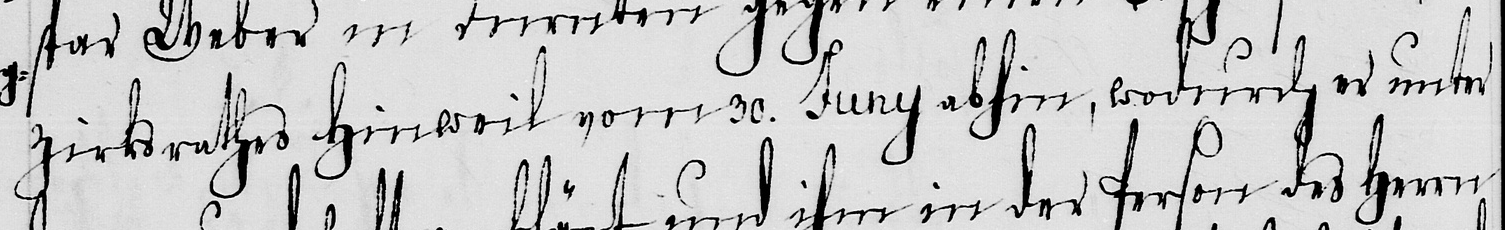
zirksrathes Hinweil vom 30. Juny abhin, wodurch er unter
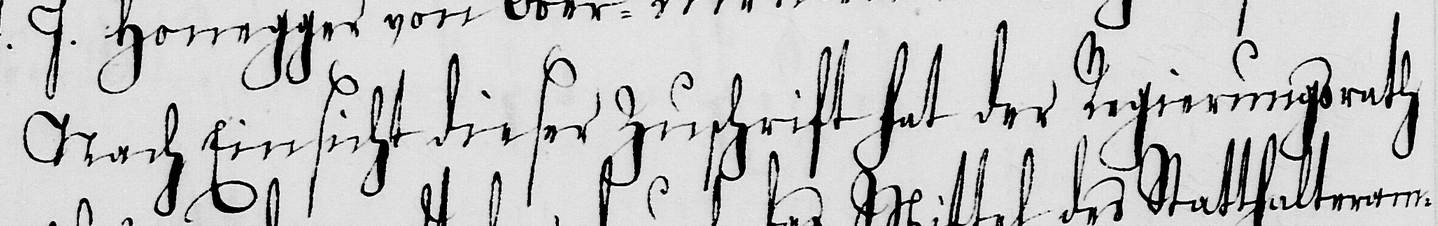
Nach Einsicht dieser Zuschrift hat der Regierungsrath
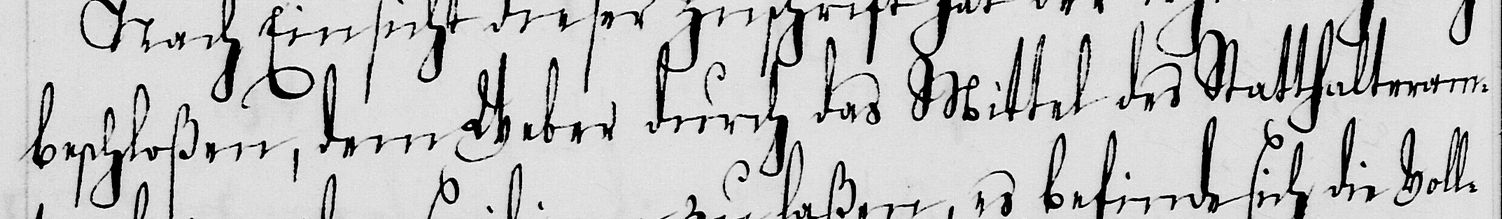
beschloßen, dem Weber durch das Mittel des Statthaltera¬
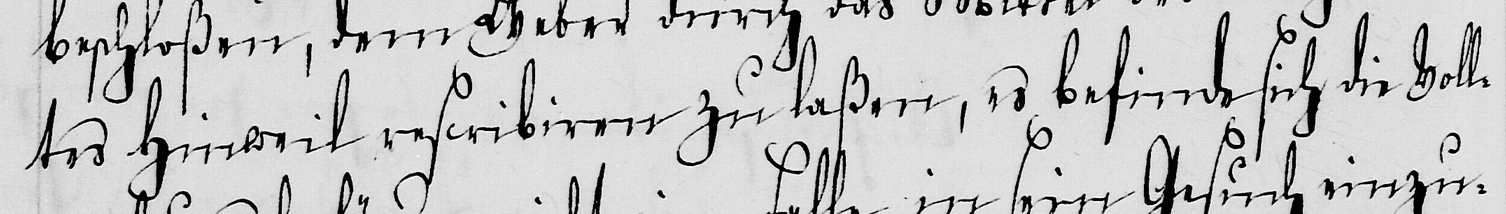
mtes Hinweil rescribiren zu laßen, es befinde sich die Vol¬
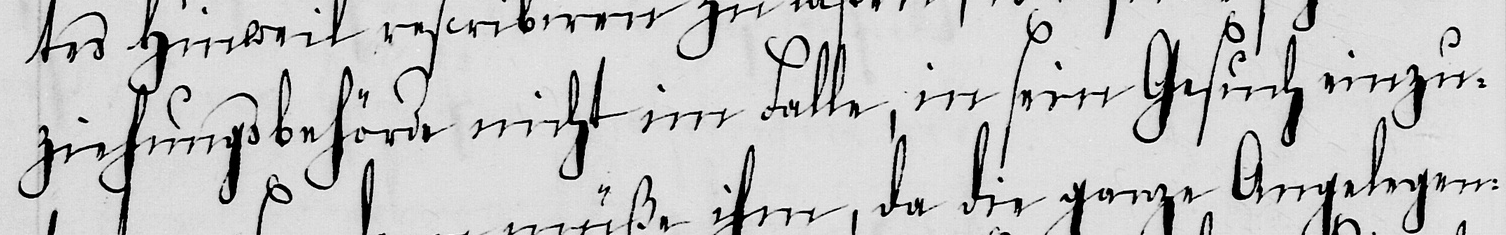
lziehungsbehörde nicht im Falle, in sein Gesuch einzu¬
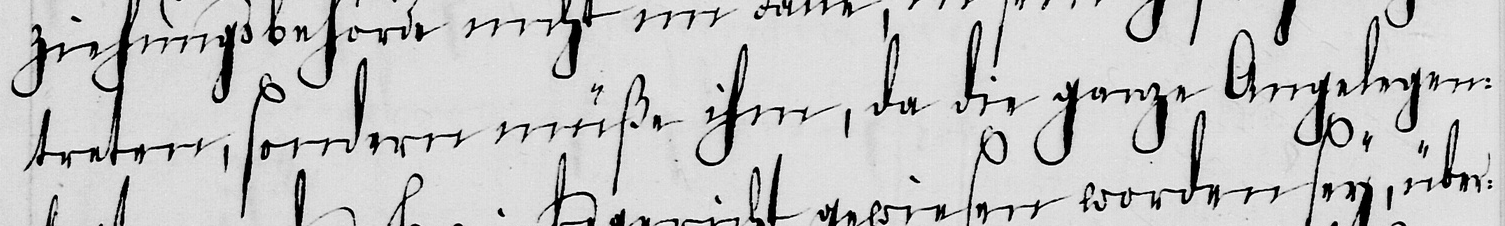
treten, sondern müße ihm, da die ganze Angelegen¬
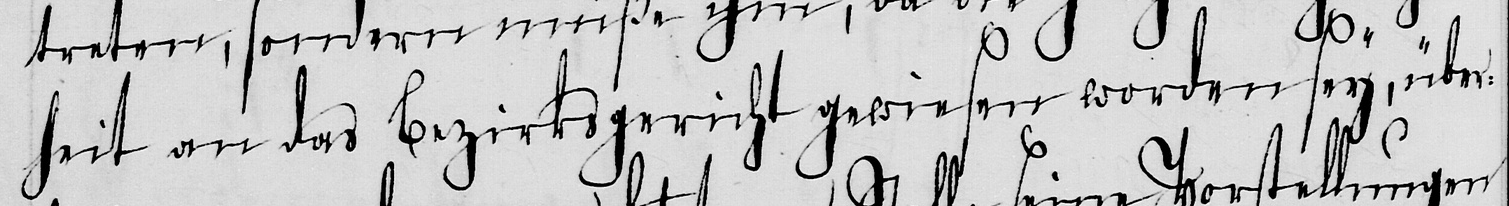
heit an das Bezirksgericht gewiesen worden sey, über¬
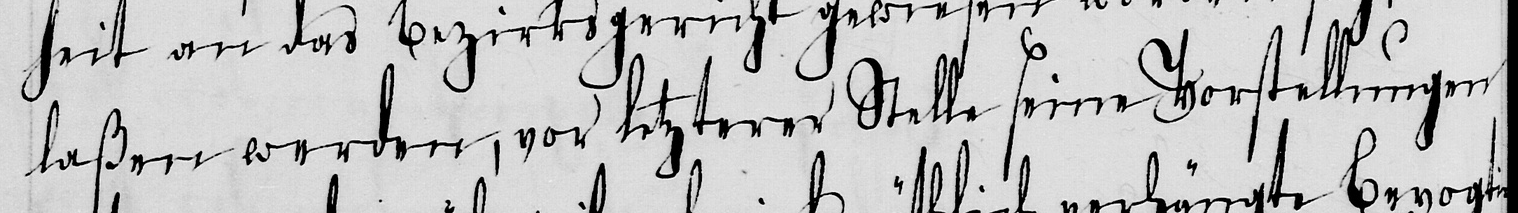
laßen werden, vor letzterer Stelle seine Vorstellungen
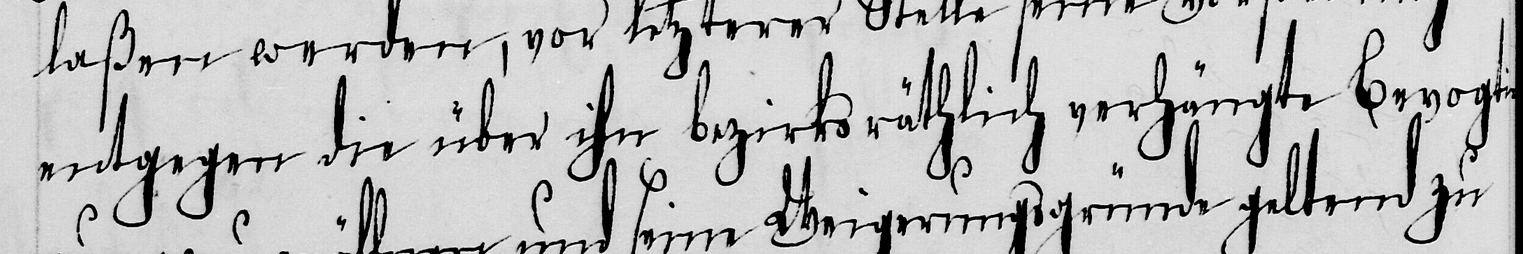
entgegen die über ihn bezirksräthlich verhängte Bevogt¬
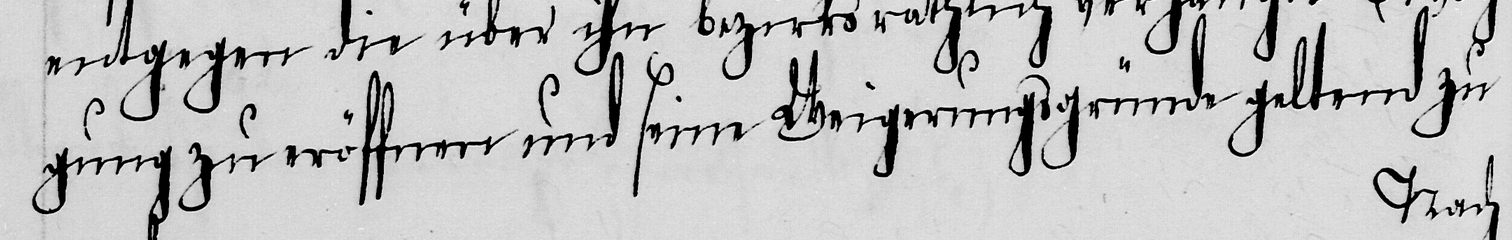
igung zu eröffnen und seine Weigerungsgründe geltend zu
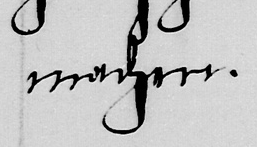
machen.
